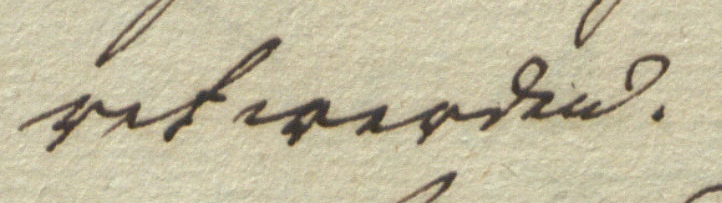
ret werden.
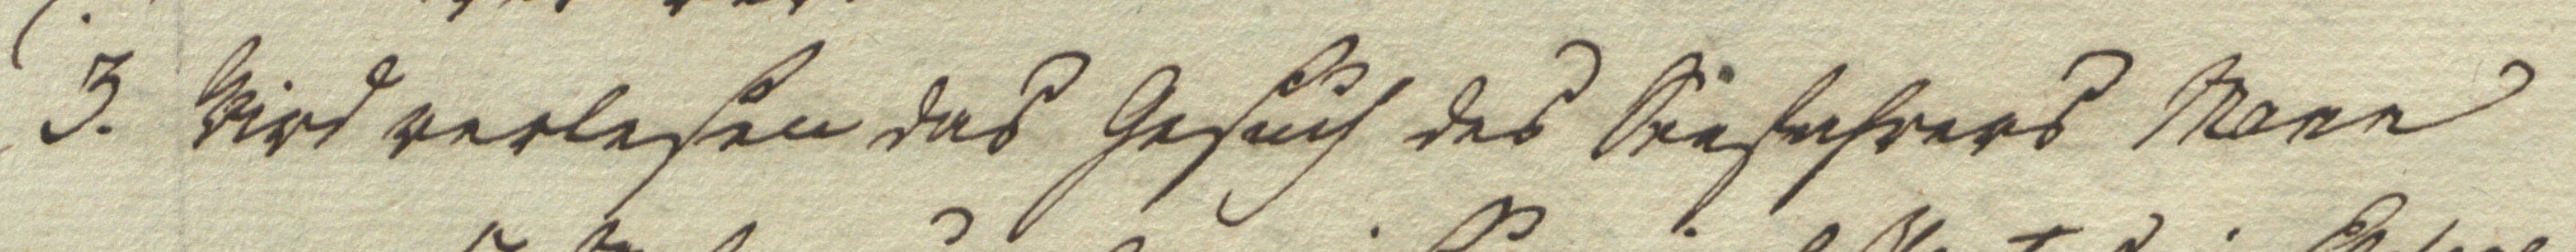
3. Wird verlesen das Gesuch des Seefahrers Mann
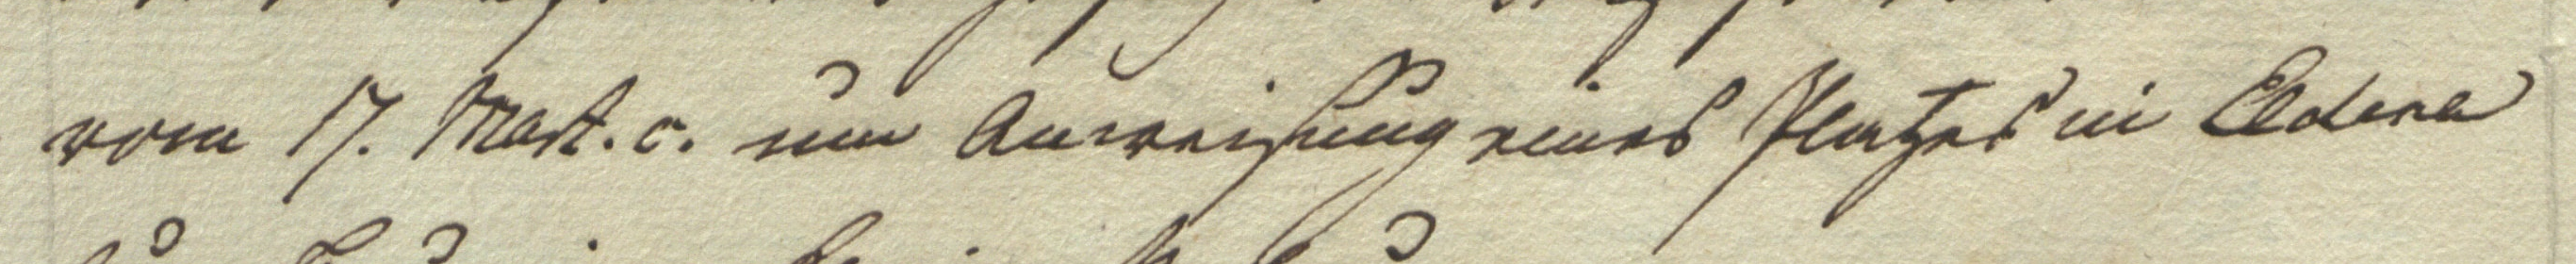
vom 17. Mart. c. um Anweisung eines Platzes in Eldena
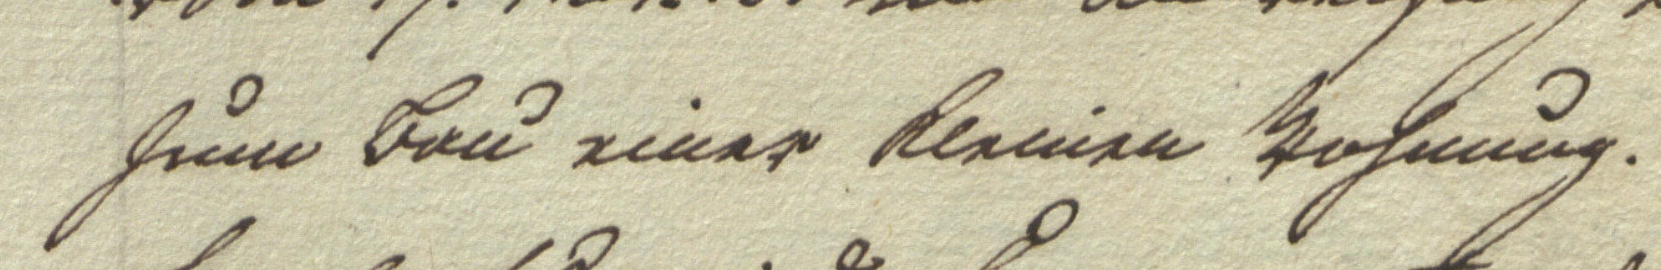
zum Bau einer kleinen Wohnung.
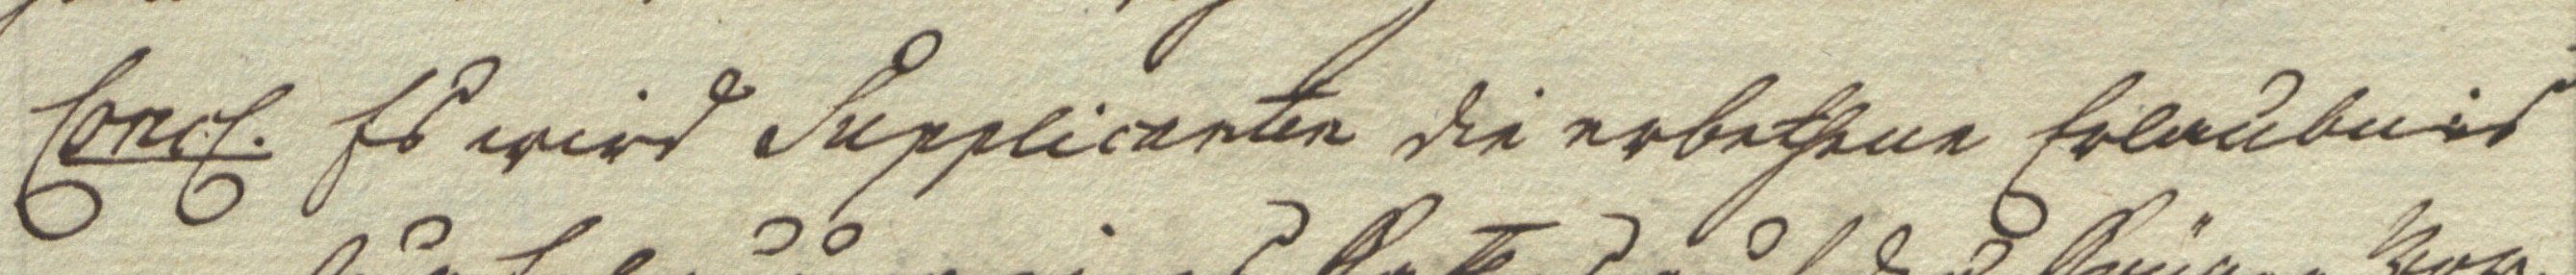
Concl Es wird Supplicanten die erbethene Erlaubnis
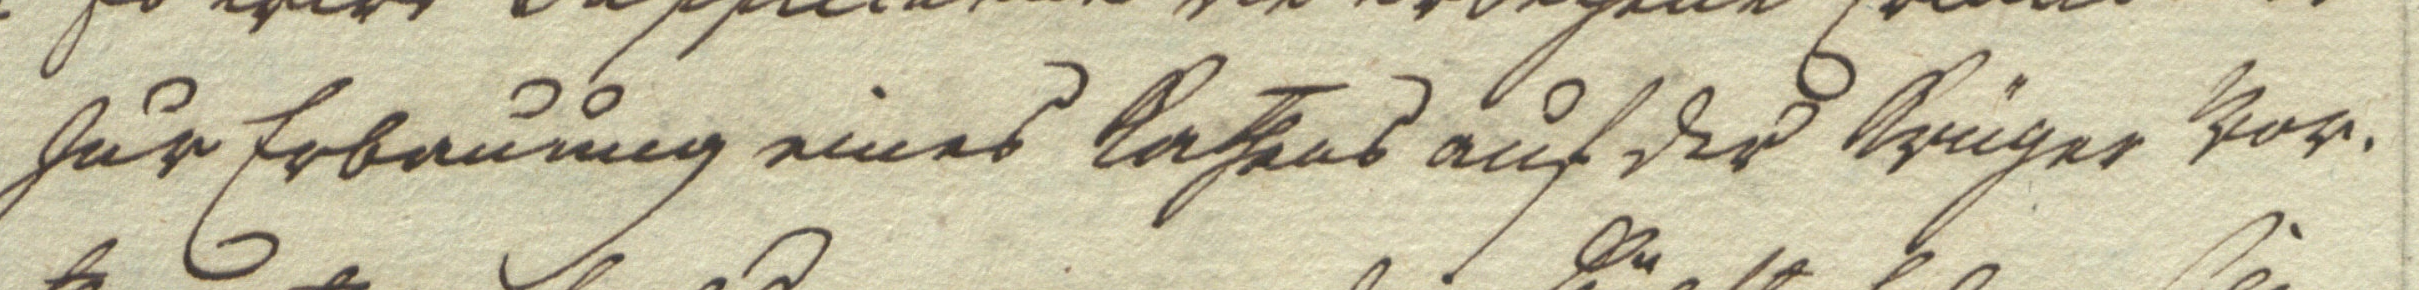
zur Erbauung eines Kathens auf des Krüger Wur¬
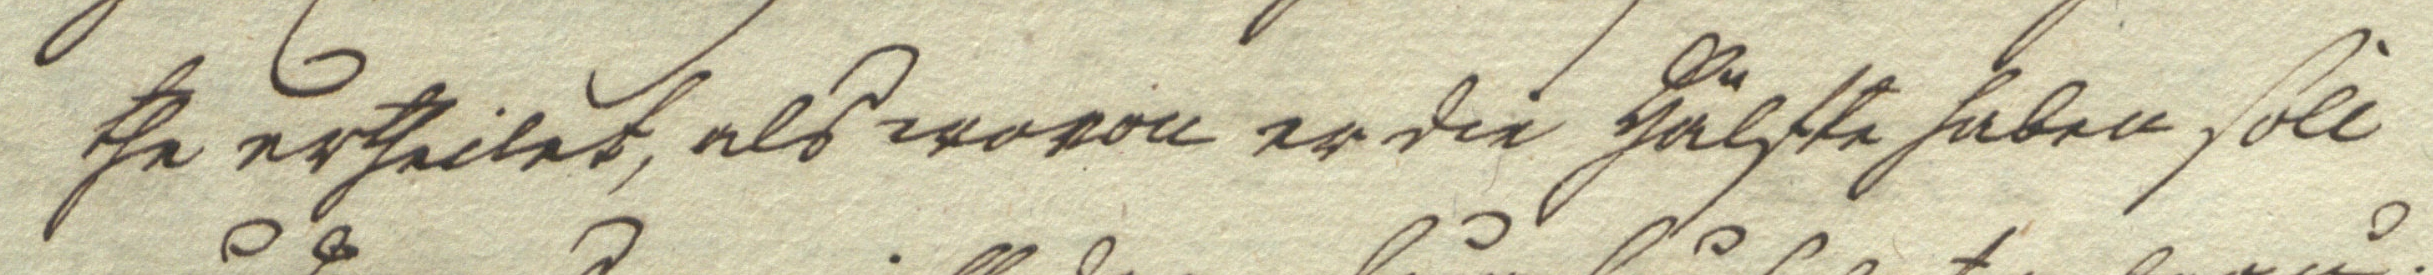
the ertheilet, als wovon er die Hälfte haben soll
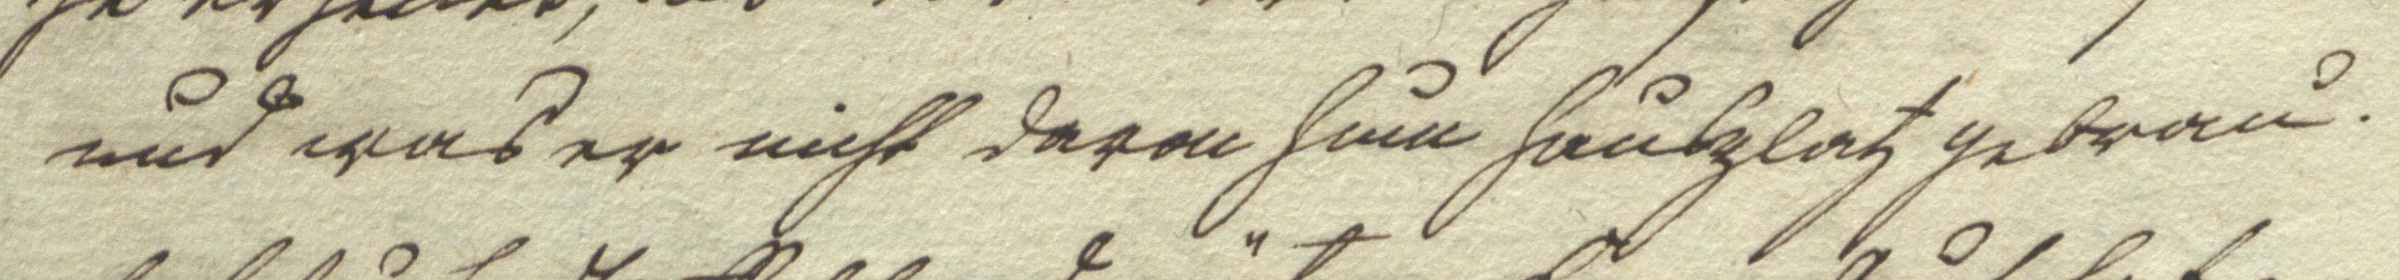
und was er nicht davon zum Hausplatz gebrau¬
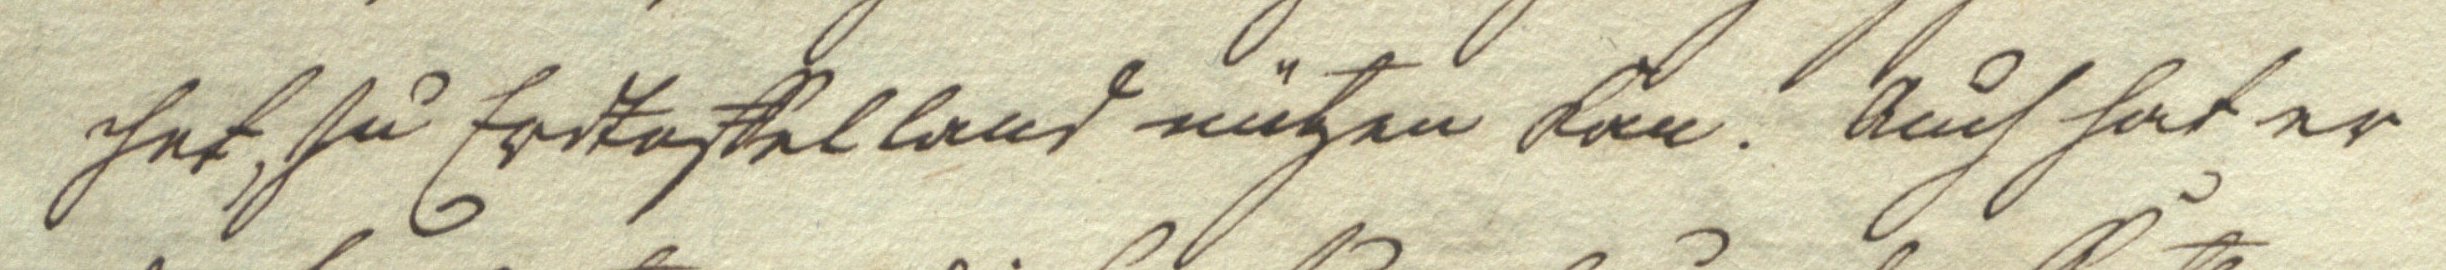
chet zu Erdtoffelland nützen kan. Auch hat er
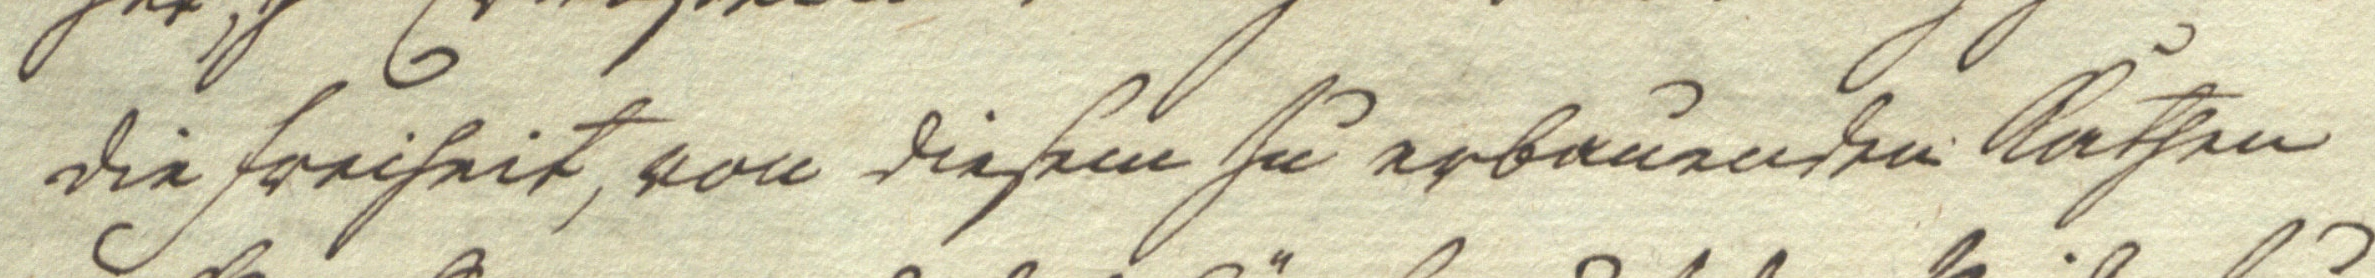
die Freiheit, von diesem zu erbauenden Kathen
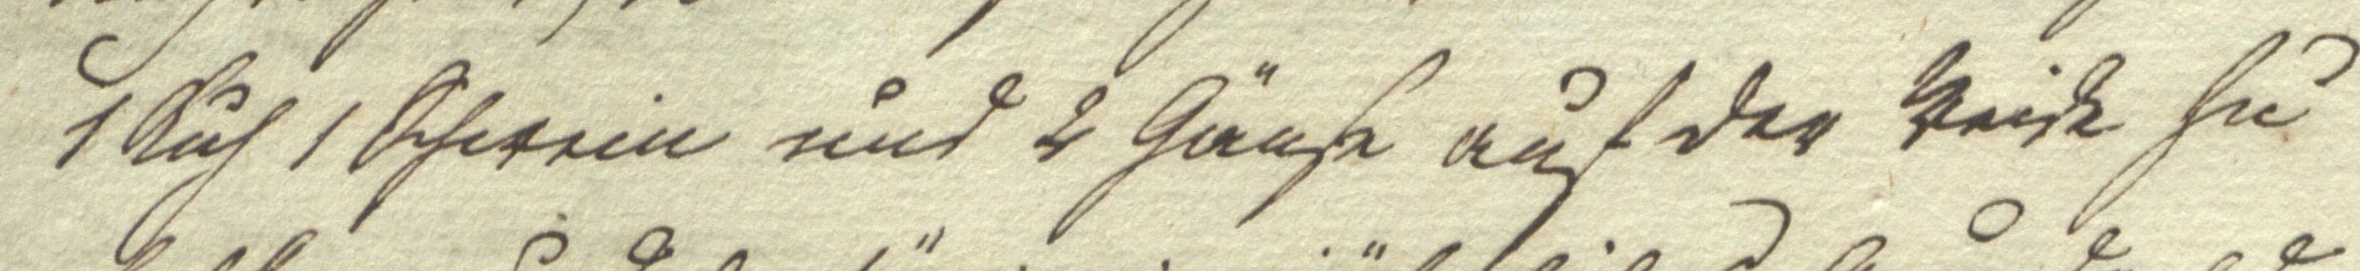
1 Kuh 1 Schwein und 2 Gänse auf der Weide zu
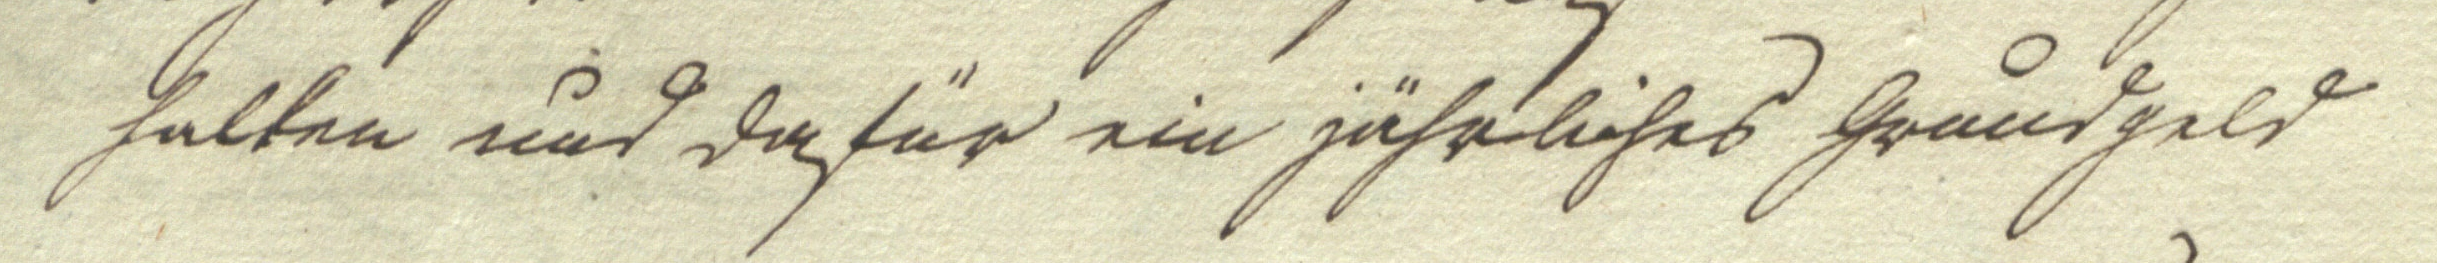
halten und dafür ein jährliches Grundgeld
